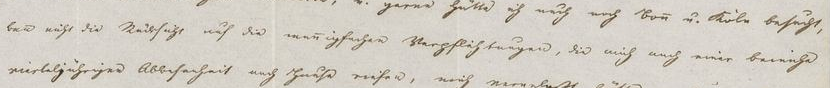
wenn nicht die Rücksicht auf die mannigfachen Verpflichtungen, die mich nach einer beinahe
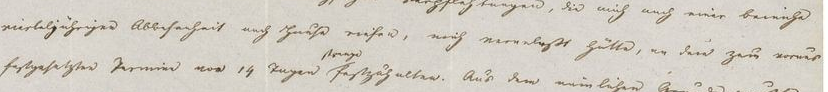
vierteljährigen Abwesenheit nach Hause riefen, mich veranlaßt hätte, an dem zum voraus
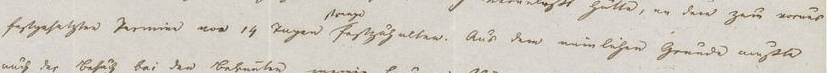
festgesetzten Termine von 14 Tagen strenge festzuhalten. Aus dem nämlichen Grunde mußte
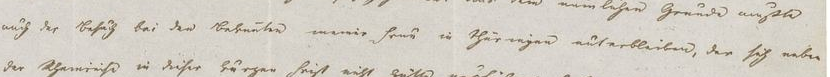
auch der Besuch bei den Bekannten meiner Frau in Thüringen unterbleiben, der sich neben
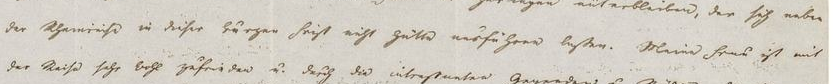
der Rheinreise in dieser kurzen Frist nicht hätte ausführen lassen. Meine Frau ist mit
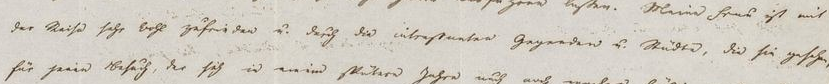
der Reise sehr wohl zufrieden u. durch die intressanten Gegenden u. Städte, die sie gesehen,
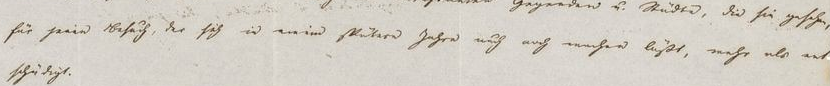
für jenen Besuch, der sich in einem spätern Jahre auch noch machen läßt, mehr als ent-
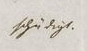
schädigt.
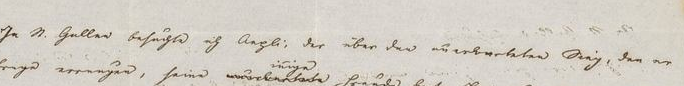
In St. Gallen besuchte ich Aepli, der über den unerwarteten Sieg, den er
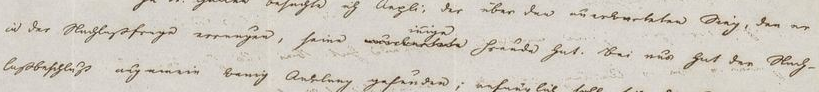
in der Nachlaßfrage errungen, seine unerwarteteinnige Freude hatte. Bei uns hat der Nach-
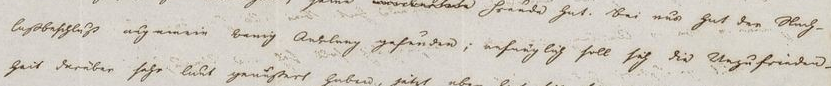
laßbeschluß ungemein wenig Anklang gefunden; anfänglich soll sich die Unzufrieden-
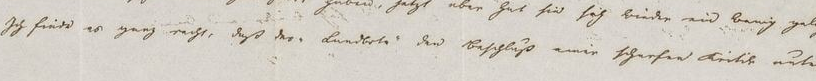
Ich finde es ganz recht, daß der «Landbote» den Beschluß einer schweren Kritik unter-
